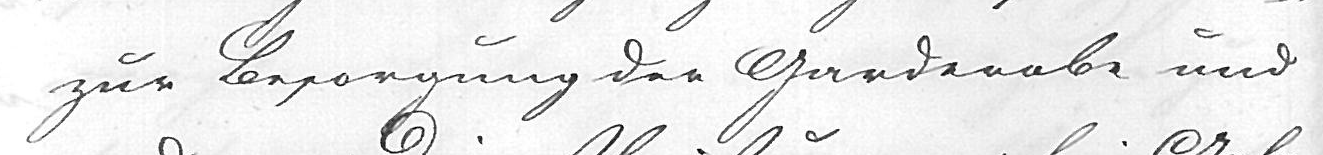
zur Besorgung der Garderobe und
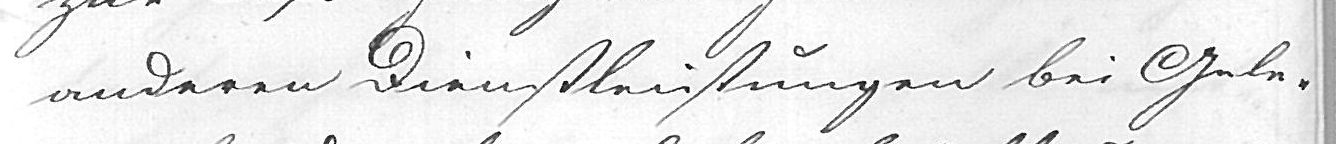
anderen Dienstleistungen bei Gele-
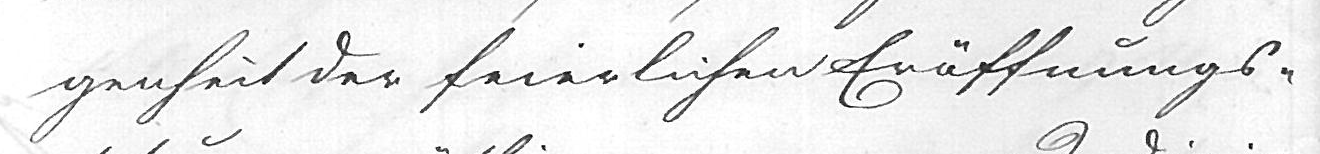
genheit der feierlichen Eröffnungs-
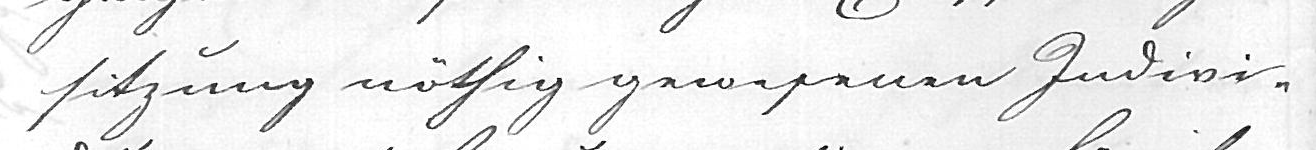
sitzung nöthig gewesenen Indivi-
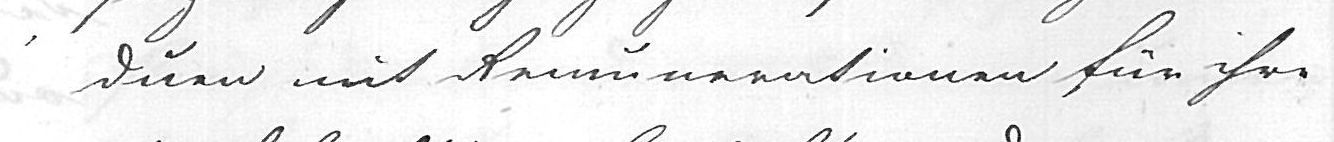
duen mit Remunerationen für ihre
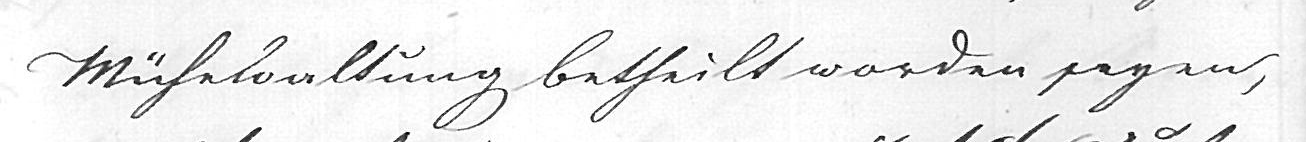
Mühewaltung betheilt worden seyen,
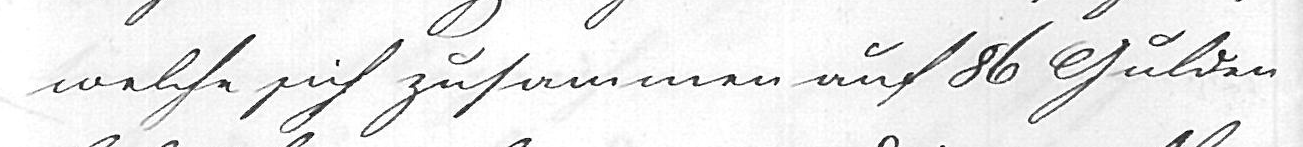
welche sich zusammen auf 86 Gulden
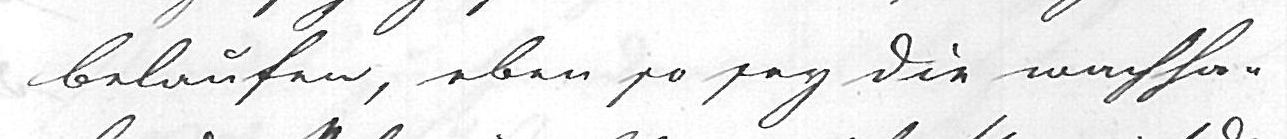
belaufen, eben so sey die wachha-
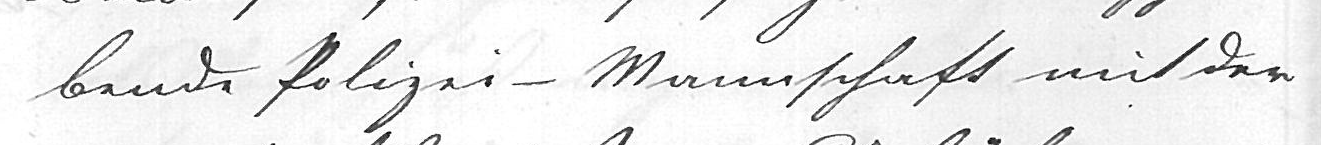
bende Polize-Mannschaft mit der
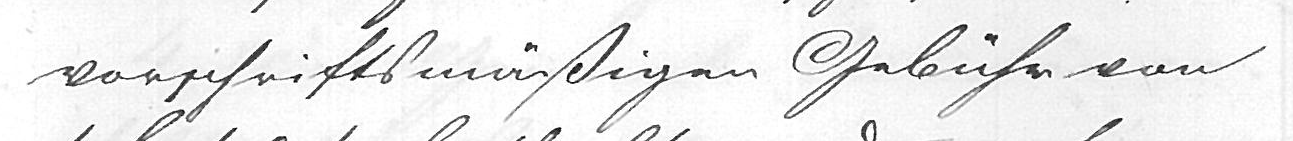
vorschriftsmäßigen Gebühr von
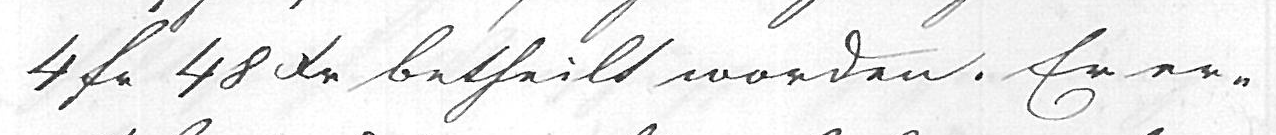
4 fl 48 kr betheilt worden. Er er-
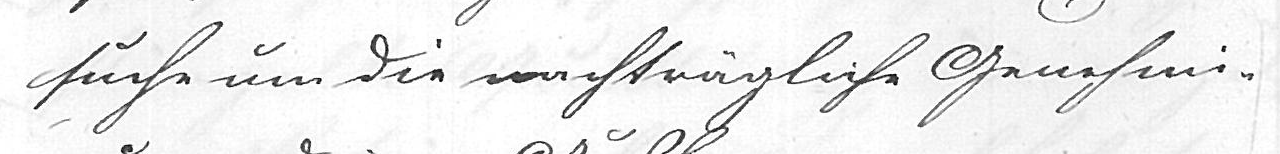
suche um die nachträgliche Genehmi-
